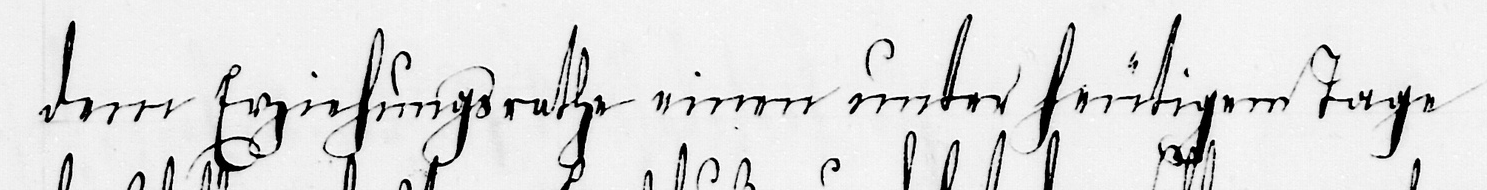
dem Erziehungsrathe einen unter heutigem Tage
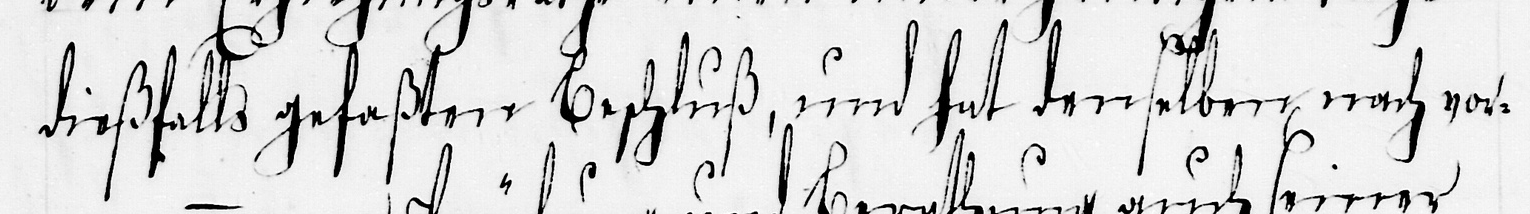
dießfalls gefaßten Beschluß, und hat denselben nach vor¬
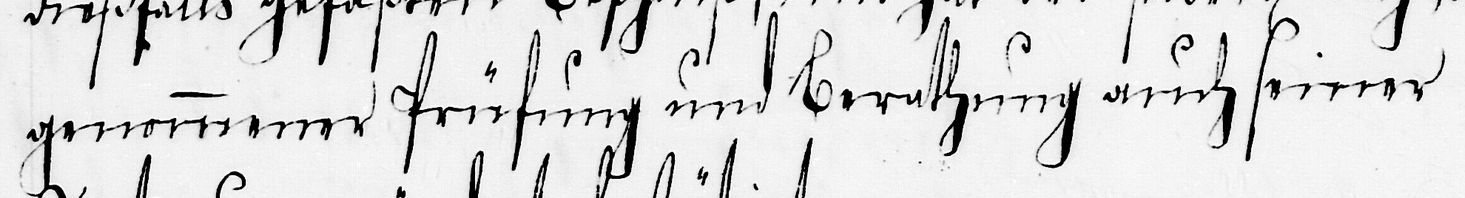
genommener Prüfung und Berathung auch seiner
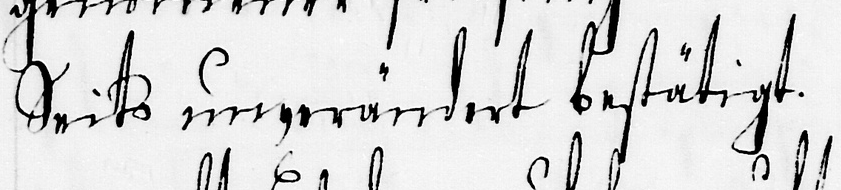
Seits unverändert bestätigt.
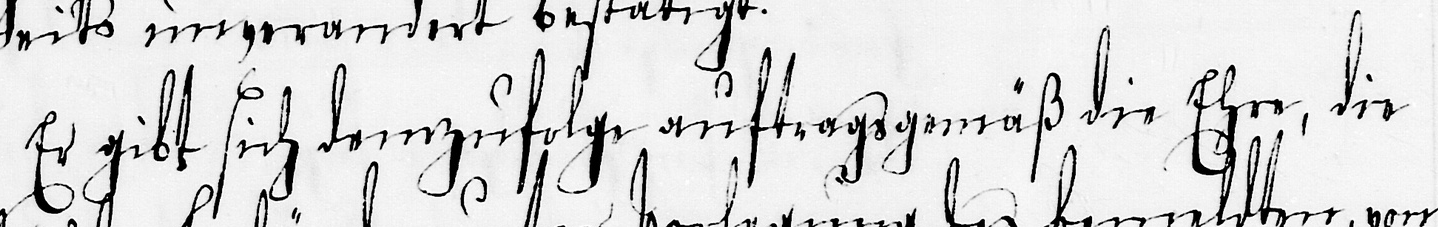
Er gibt sich demzufolge auftragsgemäß die Ehre, die
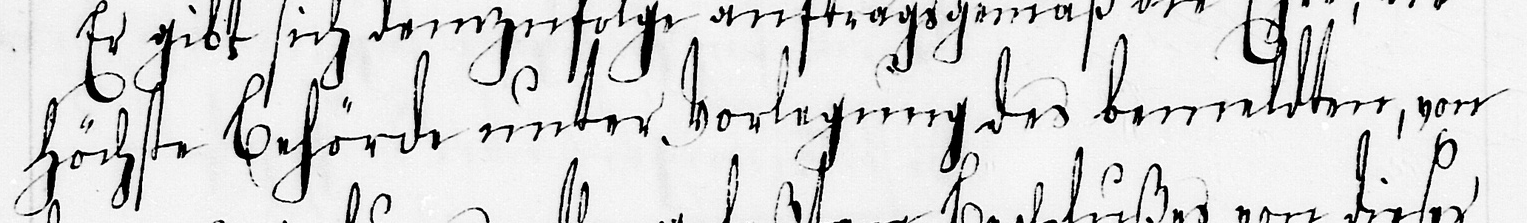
Höchste Behörde unter Vorlegung des bemeldten, von
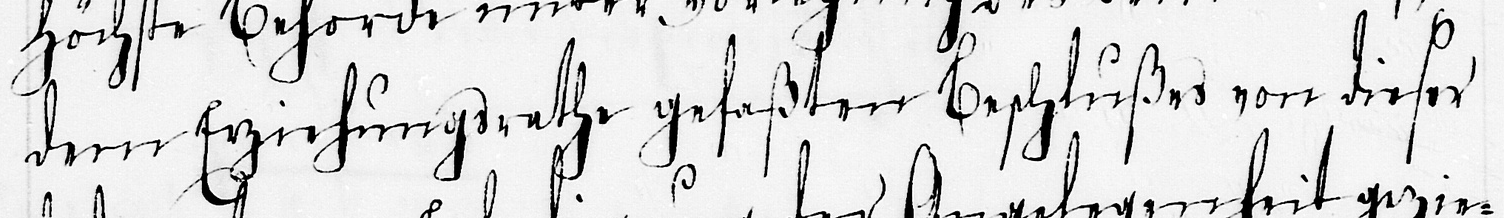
dem Erziehungsrathe gefaßten Beschlußes von dieser
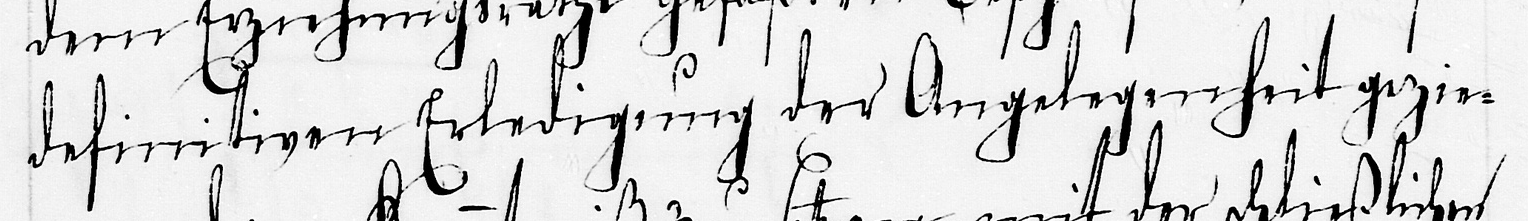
definitiven Erledigung der Angelegenheit gezie¬
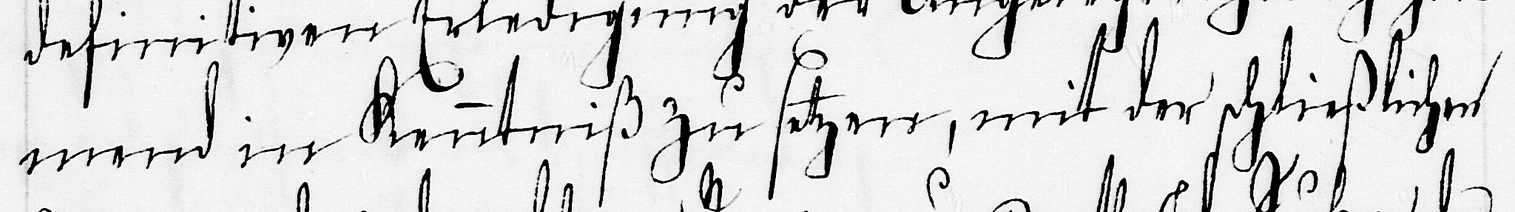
mend in Kenntniß zu setzen, mit der schließlichen
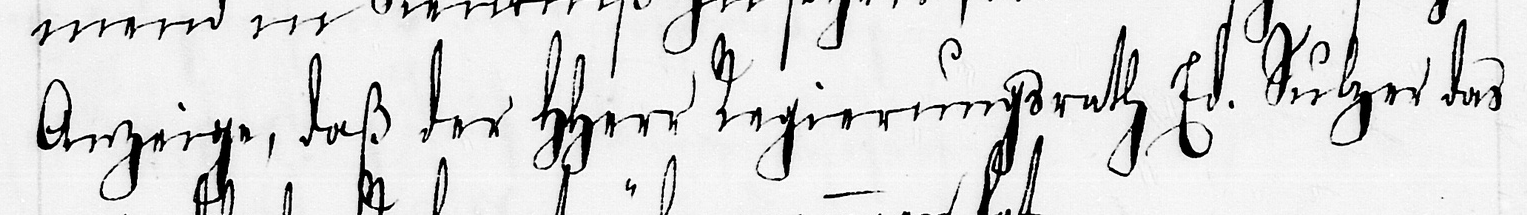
Anzeige, daß der HHerr Regierungsrath Ed. Sulzer das
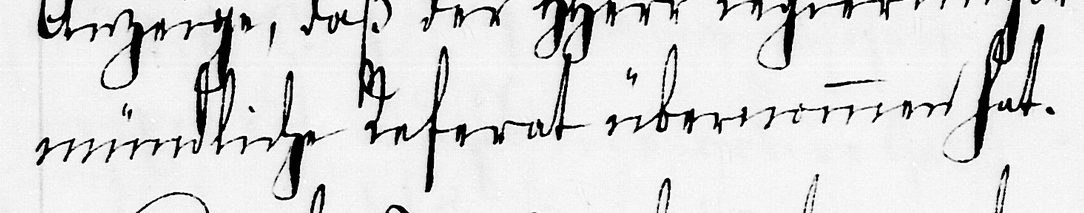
mündliche Referat übernommen hat.
